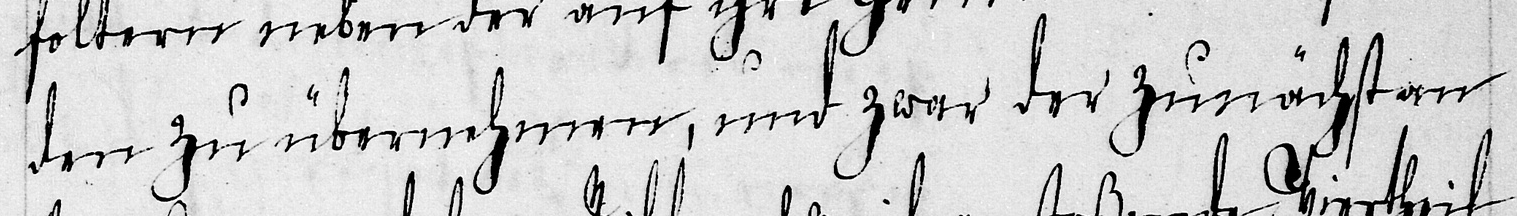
den zu übernehmen, und zwar der zunächst an
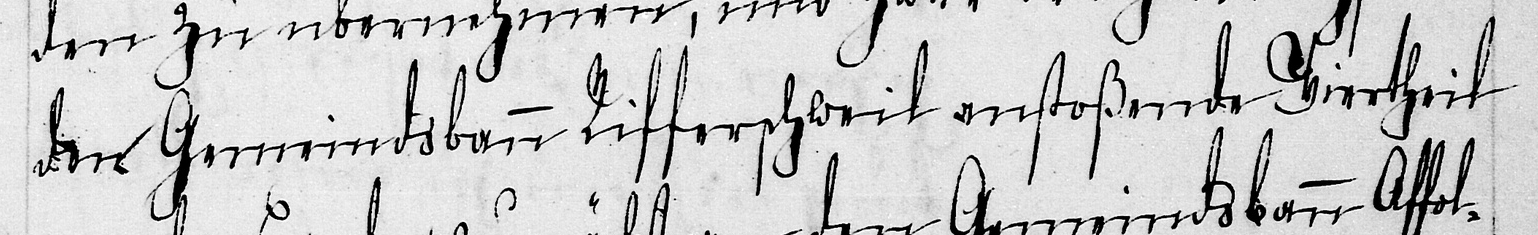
den Gemeindsbann Rifferschweil anstoßende Viertheil
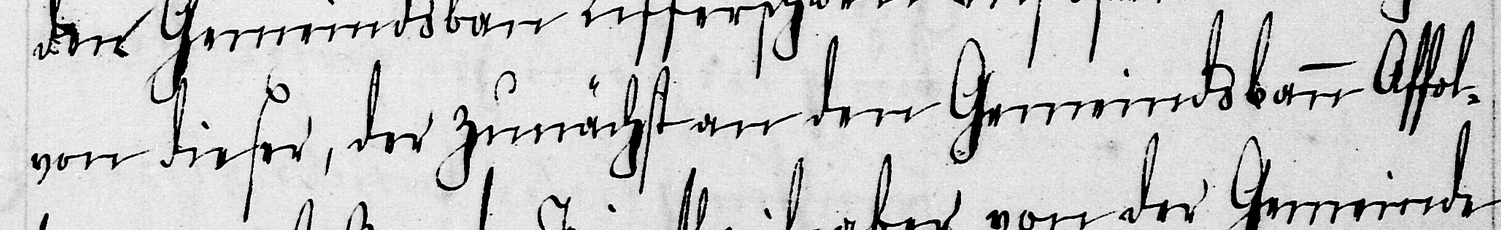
von dieser, der zunächst an den Gemeindsbann Affo¬
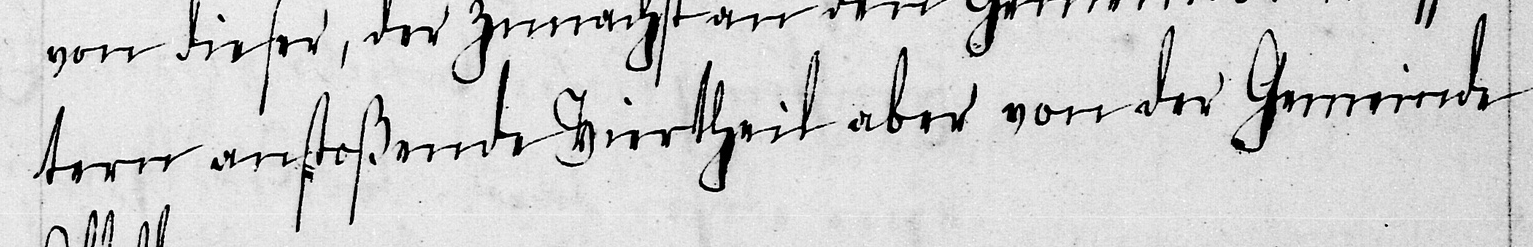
ltern anstoßende Viertheil aber von der Gemeinde
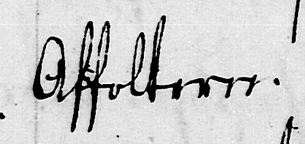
Affoltern.
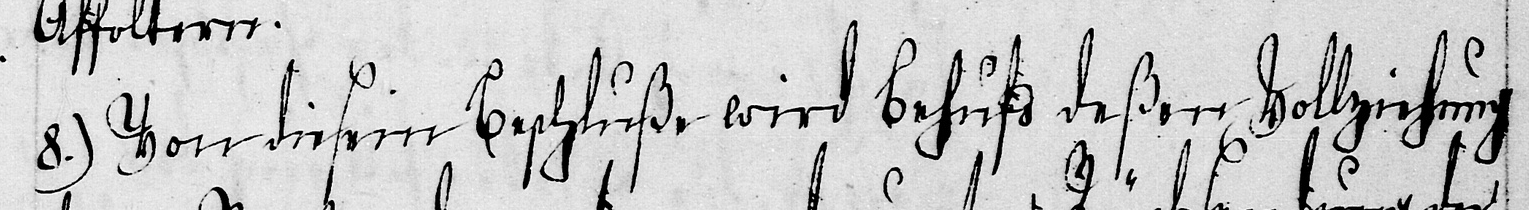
8.) Von diesem Beschluße wird Behufs deßen Vollziehung
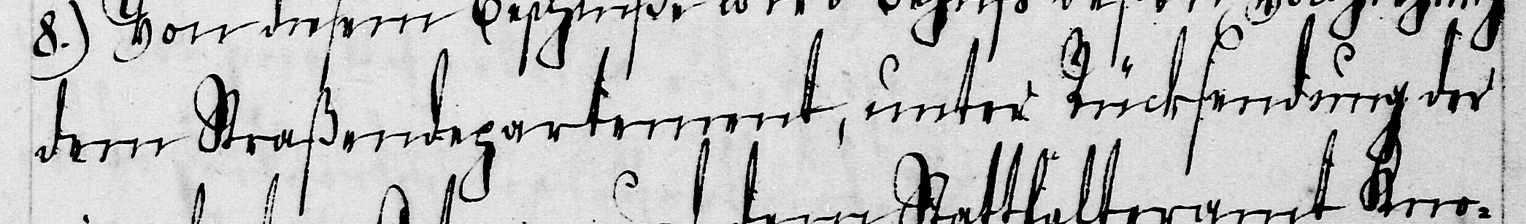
dem Straßendepartement, unter Rücksendung der
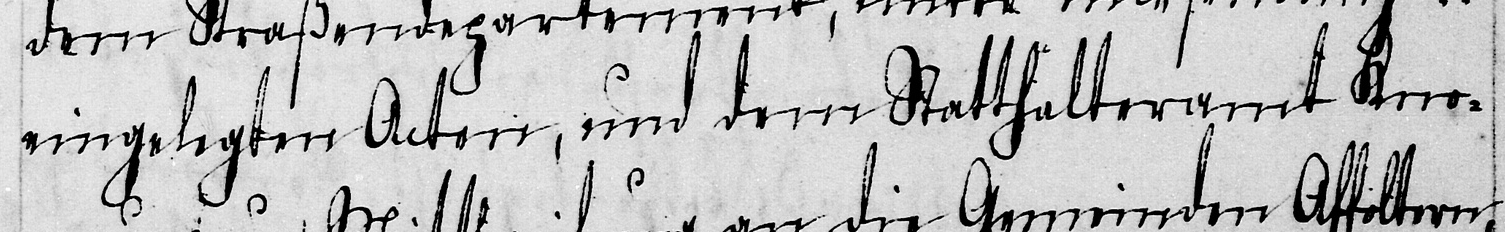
eingelegten Acten, und dem Statthalteramt Kno¬
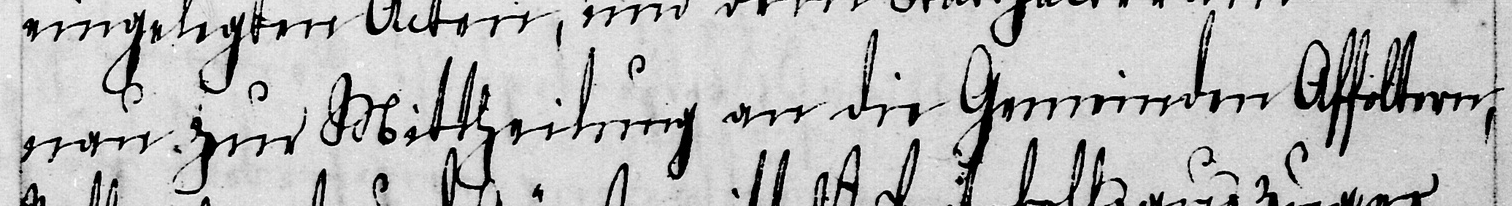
nau zur Mittheilung an die Gemeinden Affoltern,
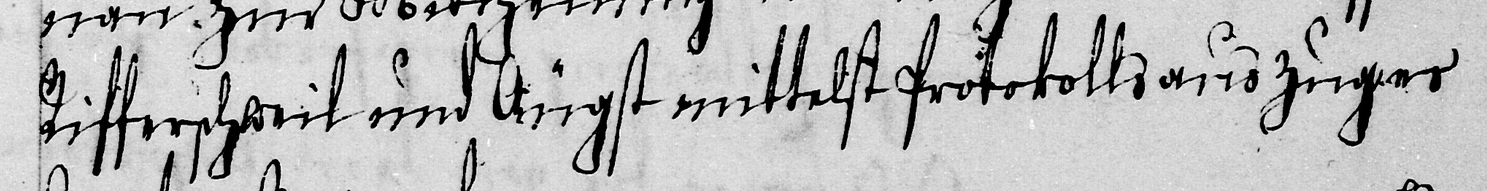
Rifferschweil und Äugst mittelst Protokollsauszuges
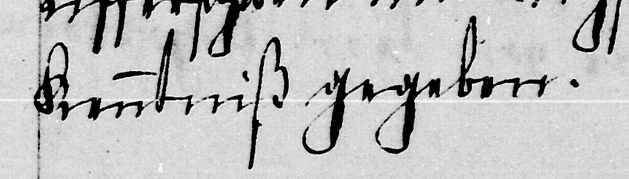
Kenntniß gegeben.
